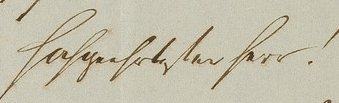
Hochgeehrtester Herr!
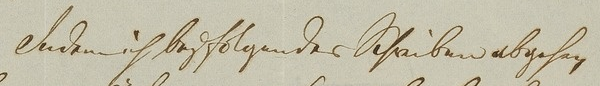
Indem ich beyfolgendes Schreiben abgehen
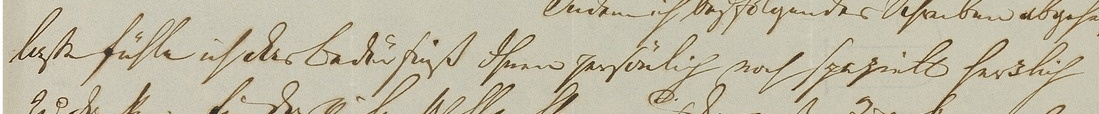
lasse fühle ich das Bedürfniß Ihnen persönlich noch speziell herzlich
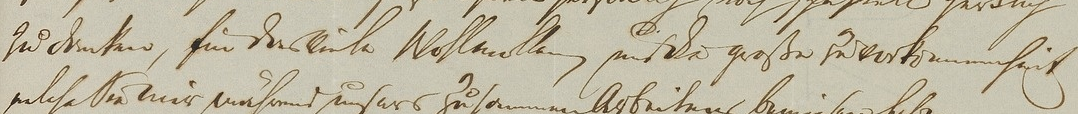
zu danken, für das viele Wohlwollen und die große Zuvorkommenheit
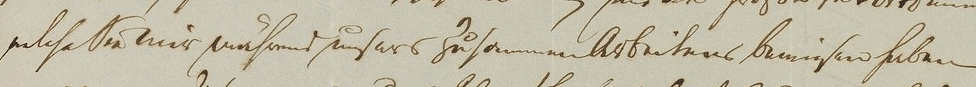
welche Sie mir während unsers Zusammen Arbeitens bewiesen haben;
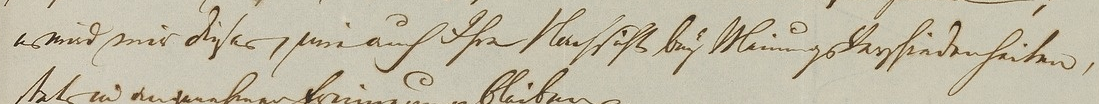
wird mir dieses, wie auch Ihre Nachsicht bey Meinungs Verschiedenheiten,
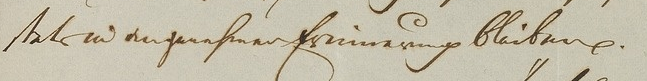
stets in angenehmer Erinnerung bleiben.
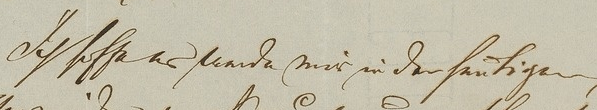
Ich hoffe es werde mir in der heutigen
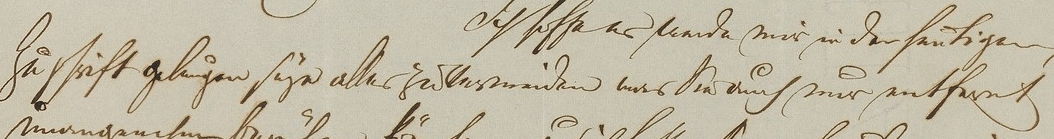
Zuschrift gelungen seyn alles zu vermeiden was Sie auch nur entfernt
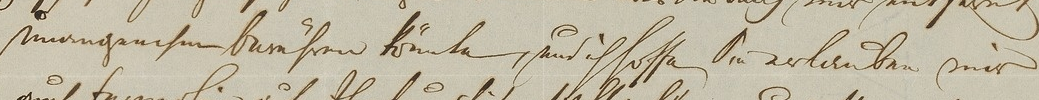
unangenehm berühren könnte, und ich hoffe Sie erlauben mir
